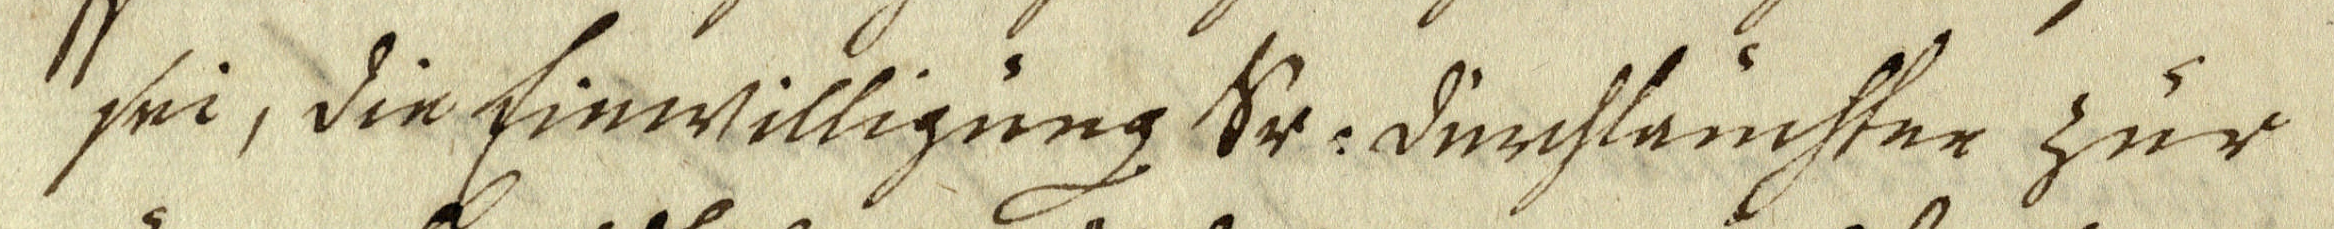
sei, die Einwilligung Sr: Durchlauchten zur
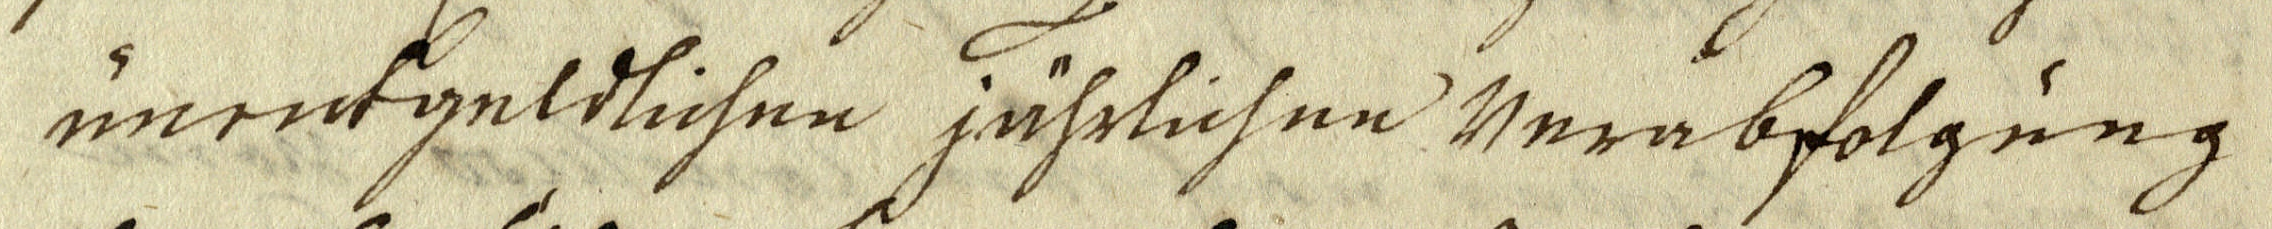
unentgeldlichen jährlichen Verabfolgung
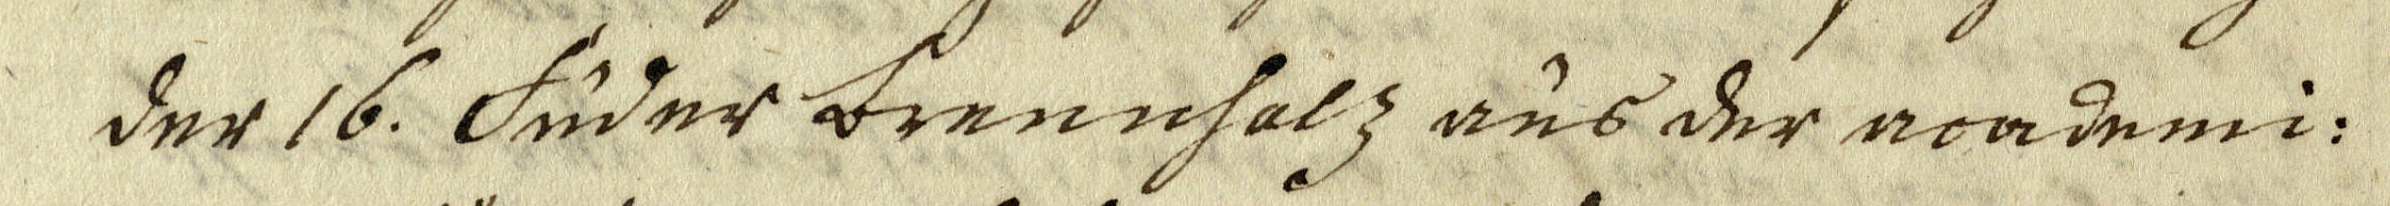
der 16. Fuder Brennholz aus der academi¬
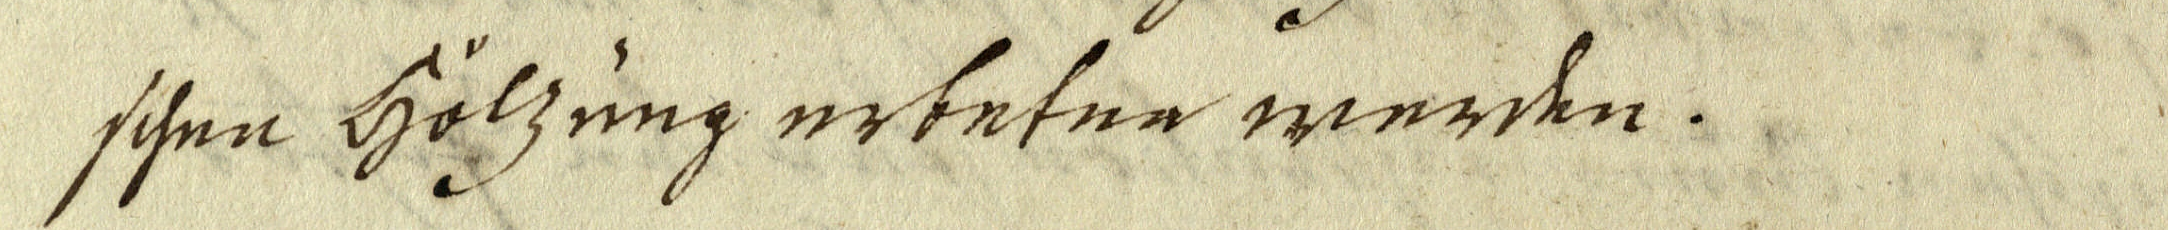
schen Hölzung erbeten werden.
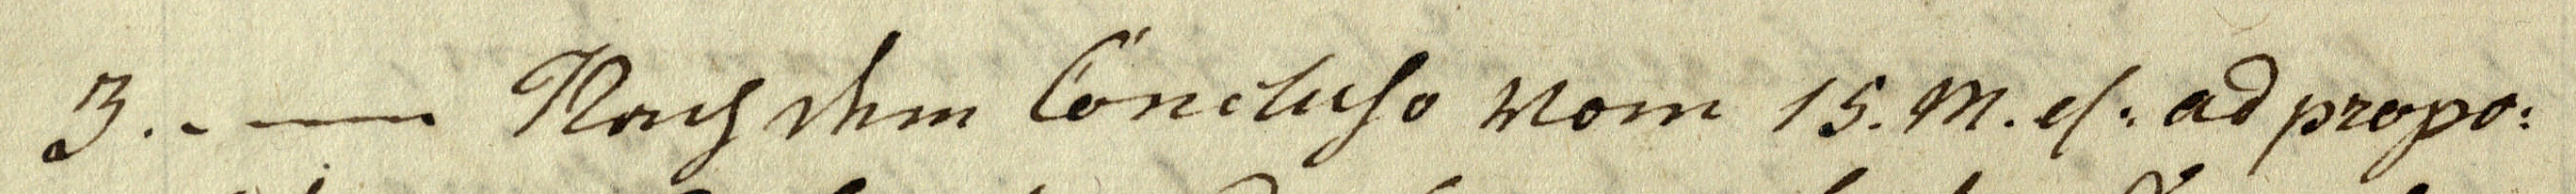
3. Nach dem Concluso vom 15. M. e. ad propo¬
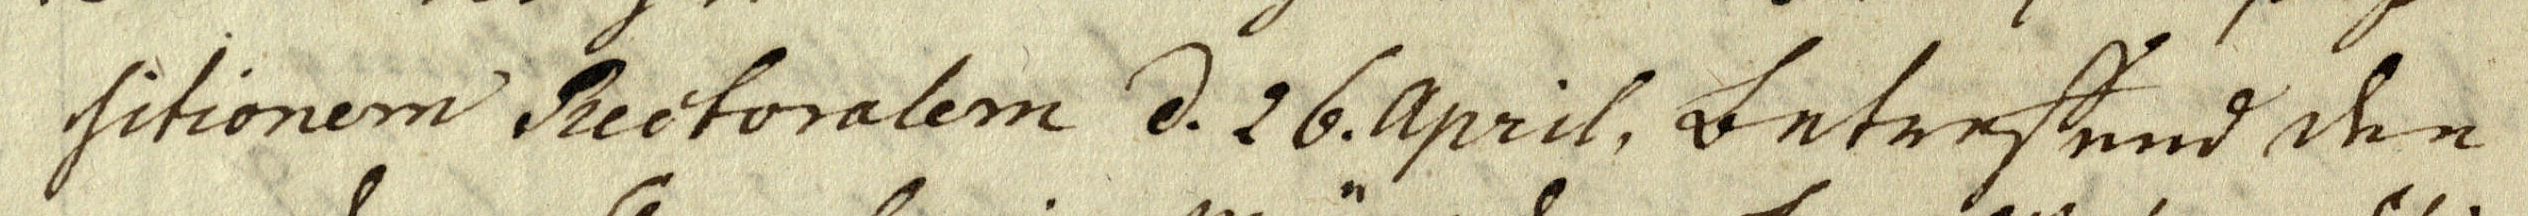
sitionem Rectoratem d. 26. April. betreffend den
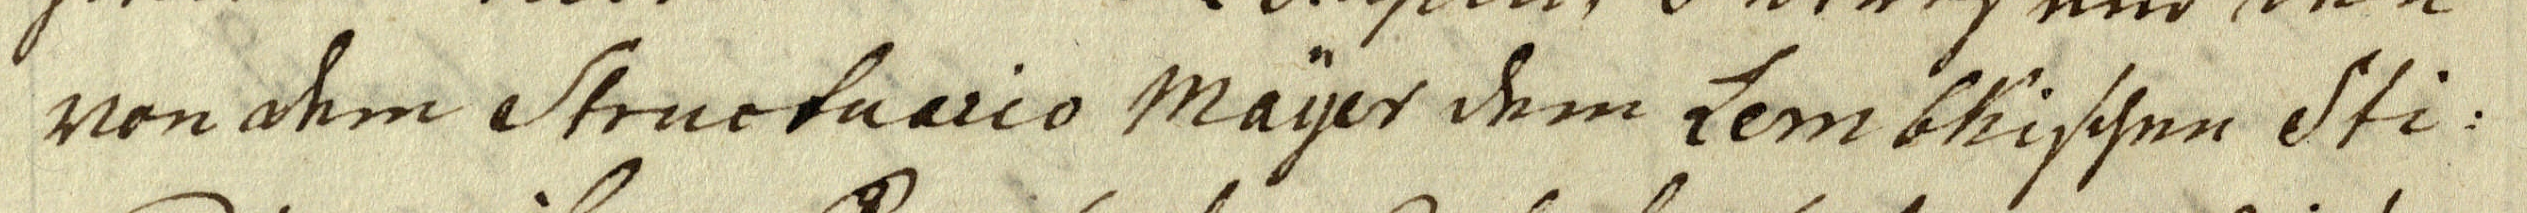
von dem Structuario Maÿer dem Lembkischen Sti¬
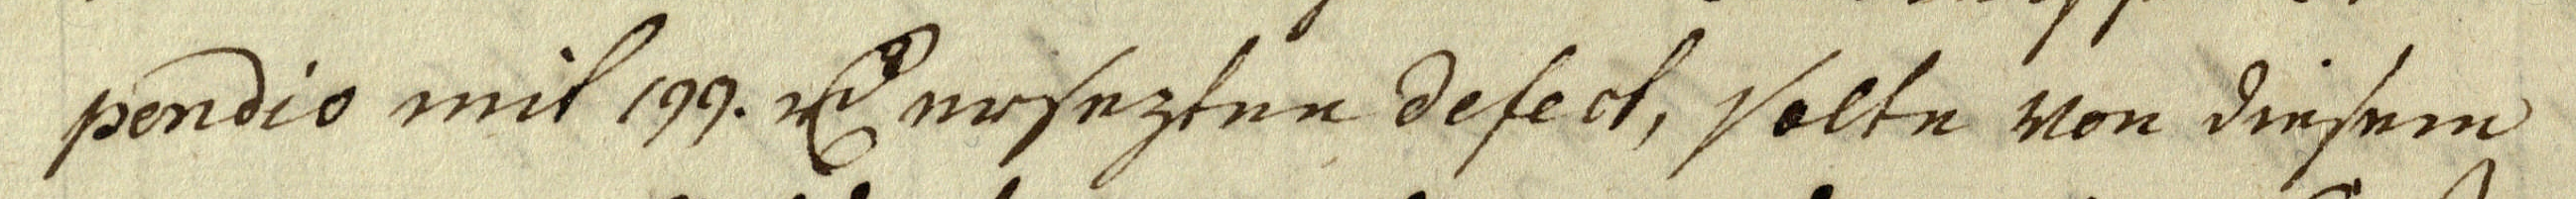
pendio mit 199 r. ersetzten defect, solte von diesem
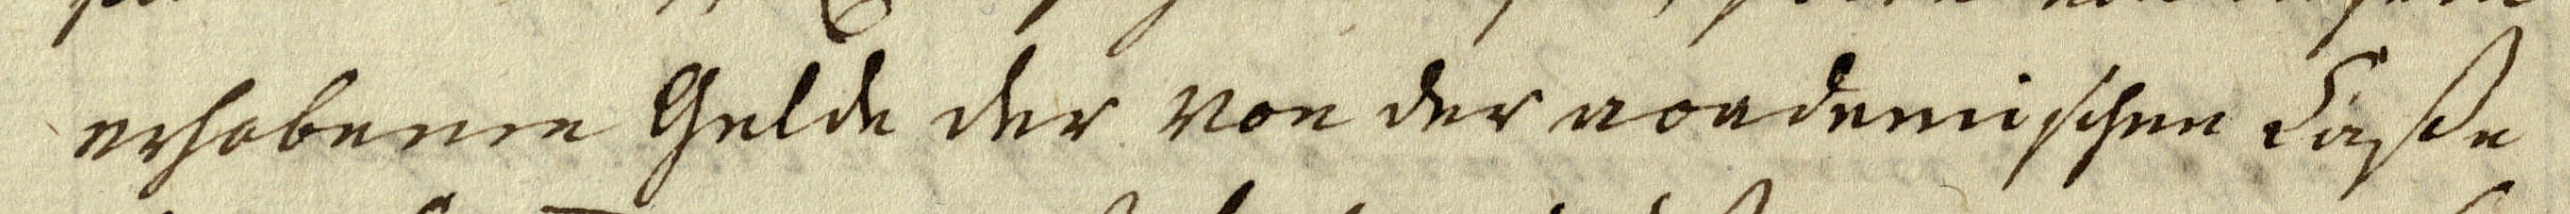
erhobenen Gelde der von der academischen Caße
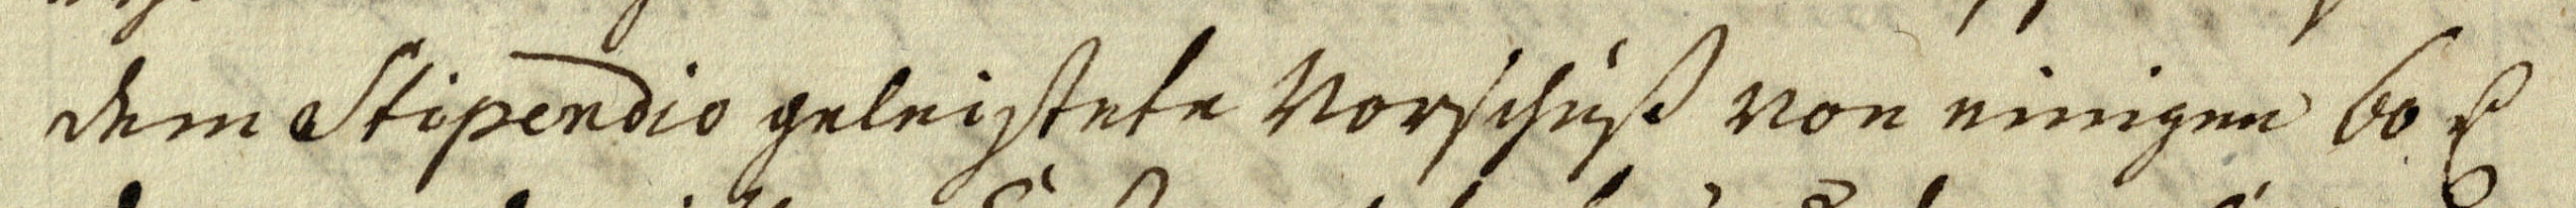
dem Stipendio geleistete Vorschuß von einigen 60 r.
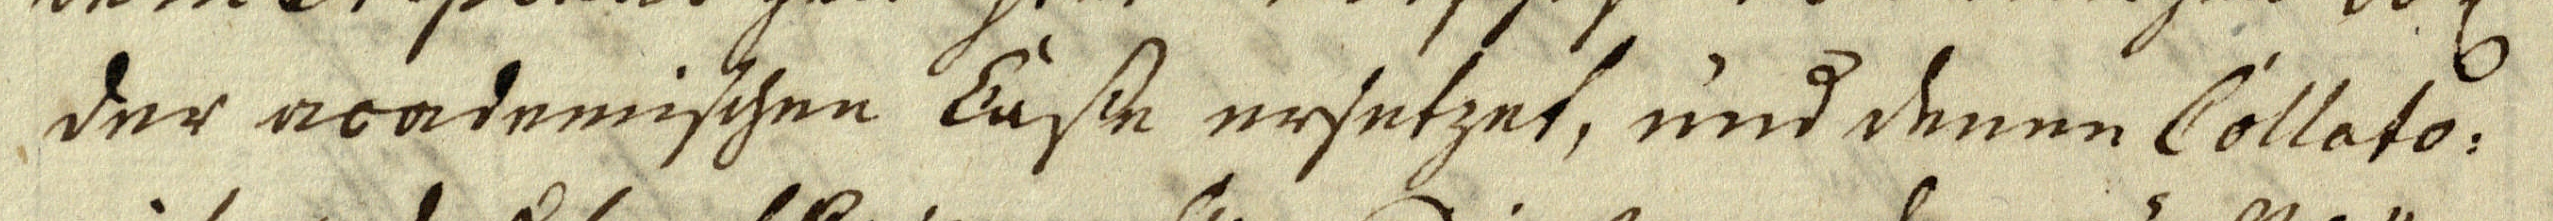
der academischen Caße ersetzet, und denen Collato¬
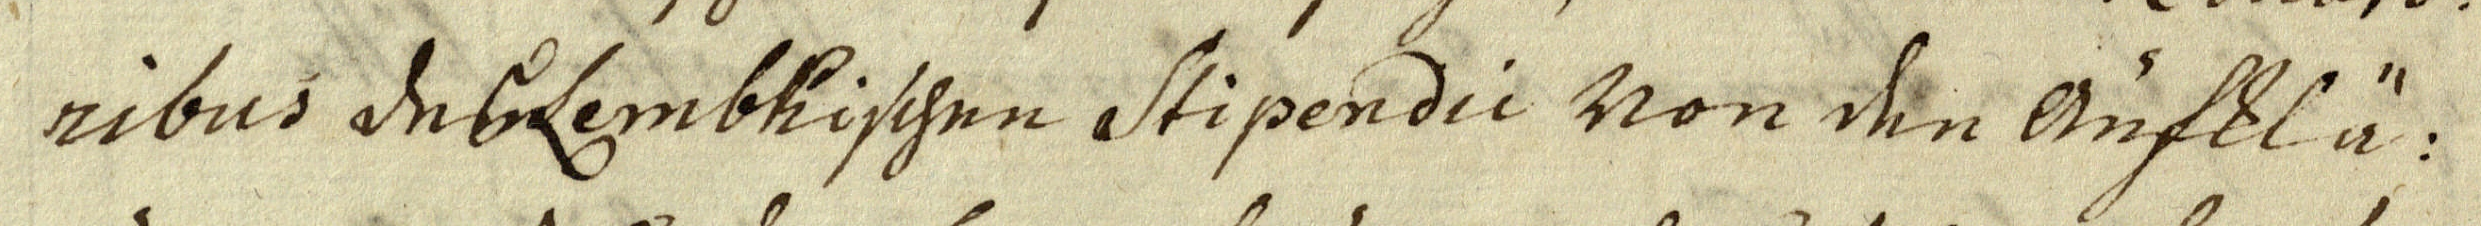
ribus des Lembkischen Stipendii von den Aufklä¬
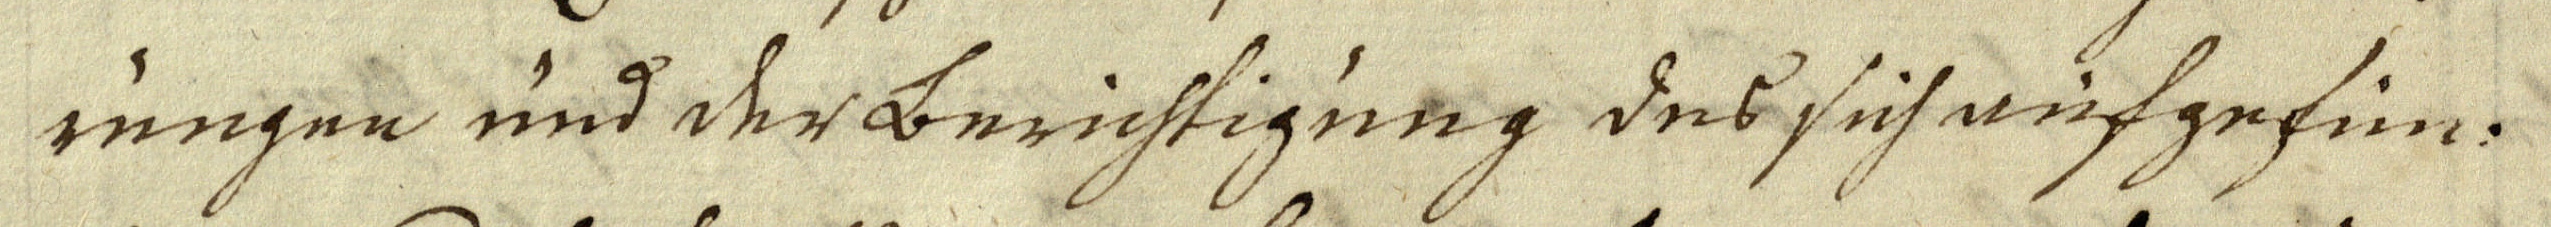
rungen und der Berichtigung des sich aufgefun¬
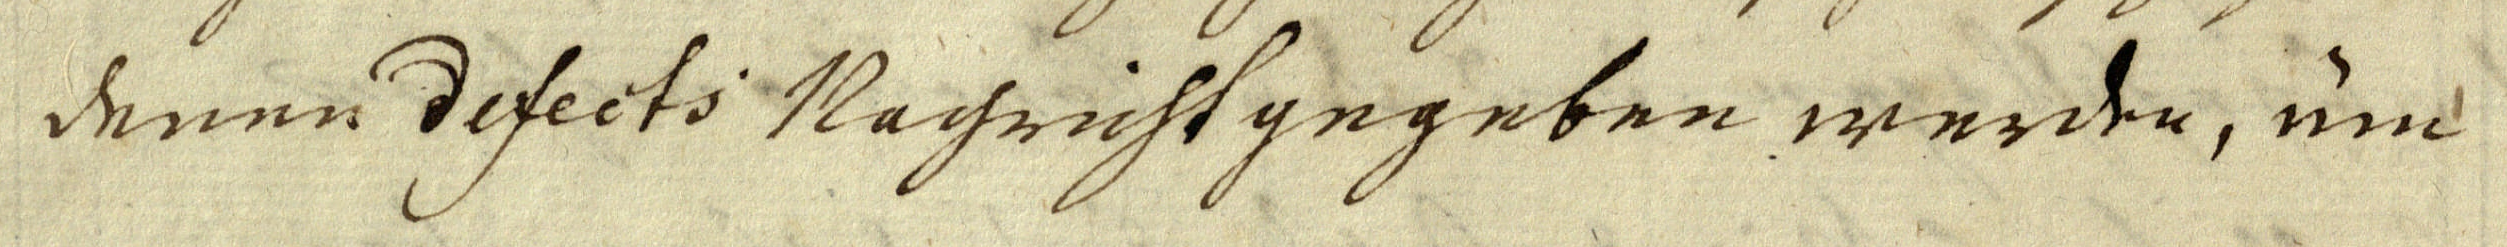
denen defects Nachricht gegeben werden, um
